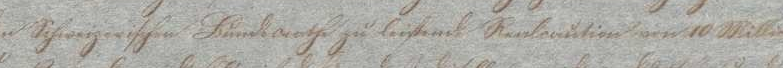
dem Schweizerischen Bundesrathe zu leistende Realcaution von 10 Millionen
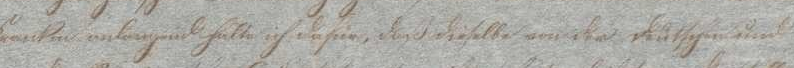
Franken anlangend halte ich dafür, daß dieselbe von der Deutschen und
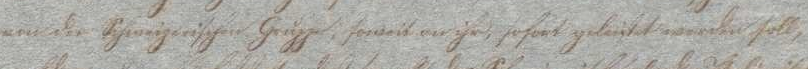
von der Schweizerischen Gruppe, soweit an ihr, sofort geleistet werden soll,
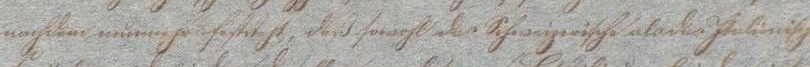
nachdem nunmehr feststeht, daß sowohl das Schweizerische als das Italienische
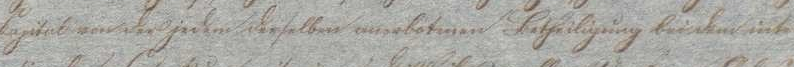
Kapital von der jedem derselben anerbotenen Betheiligung bei dem inter-
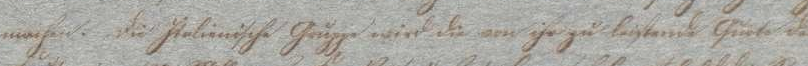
machen. Die Italienische Gruppe wird die von ihr zu leistende Quote der
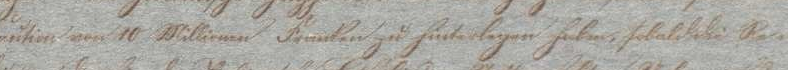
Kaution von 10 Millionen Franken zu hinterlegen haben, sobald die Re-
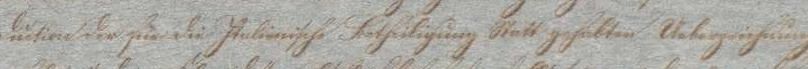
duction der für die Italienische Betheiligung Statt gehabten Ueberzeichnung
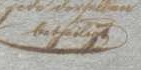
derselben
